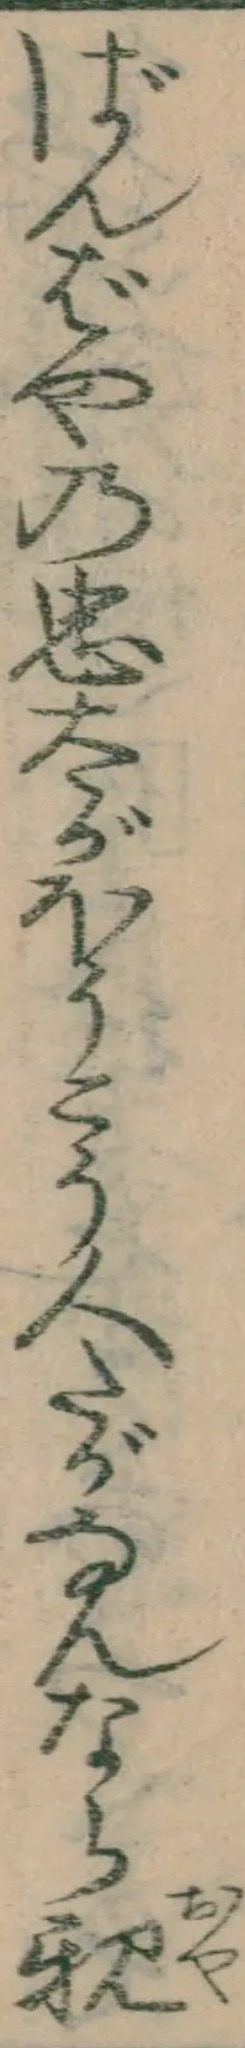ばんばやの忠太がほうこう人たがなんなら親
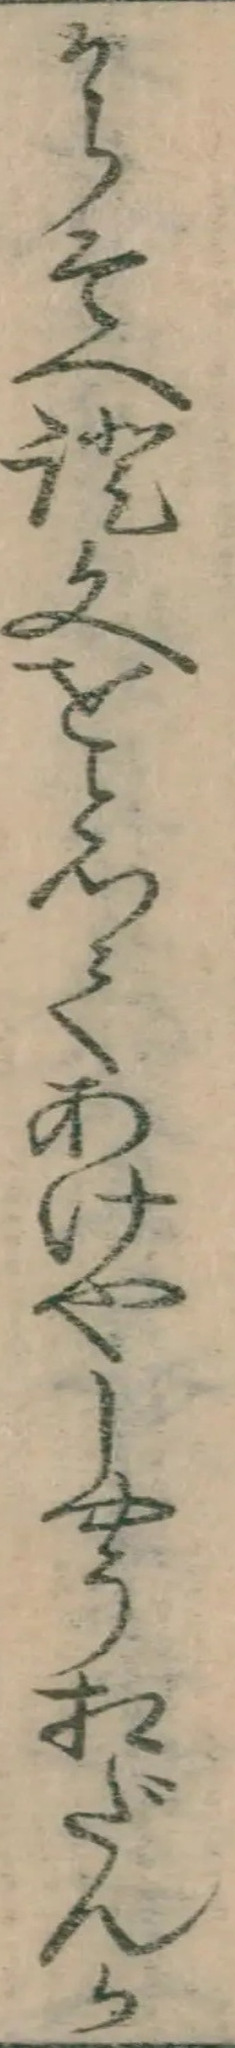からそへ証文をとつてあけやしやう相だんか

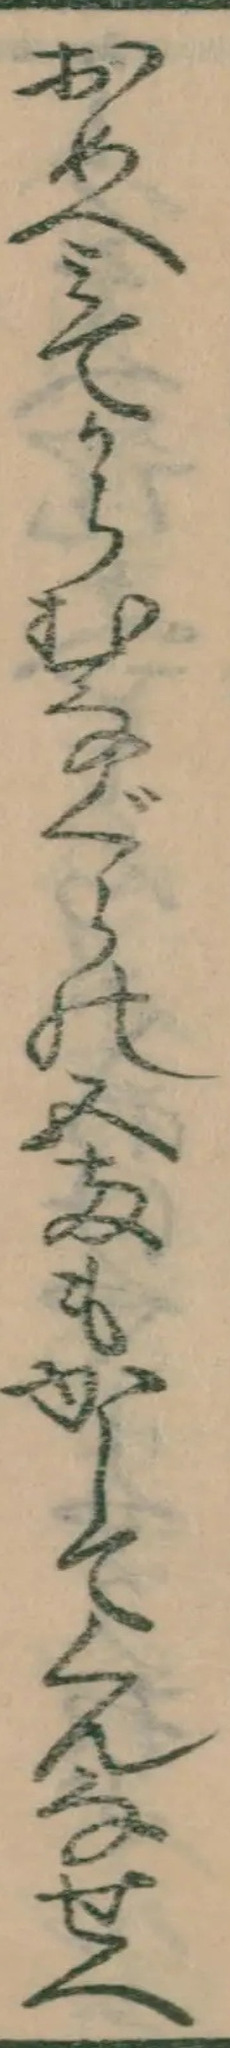おめへみてからむなぐらの五両もかしてくんなせへ
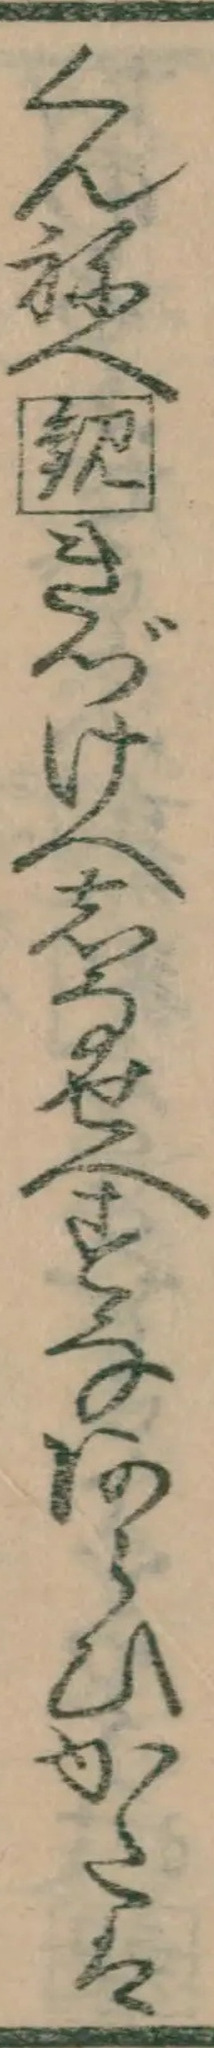くんねへ〈朝〉きづけへしなせへすなあらひかたは
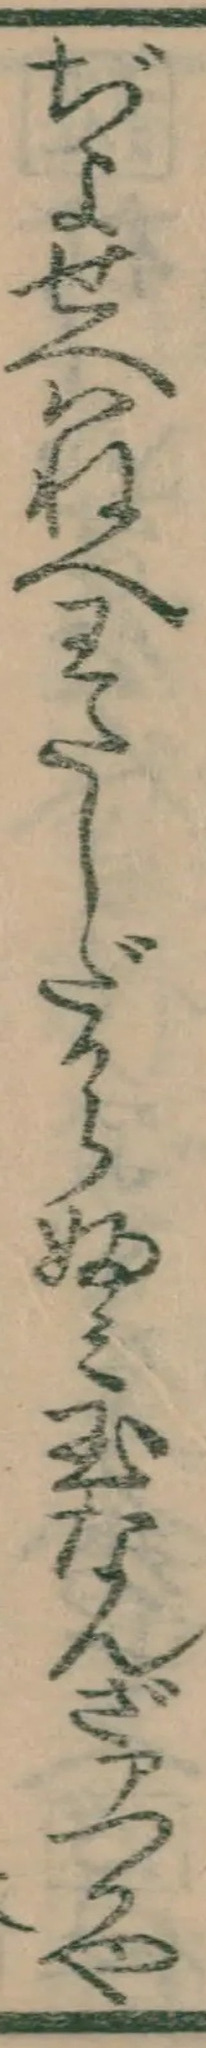ぢよせへはねへわたしだからふみ玉なんざァつかや
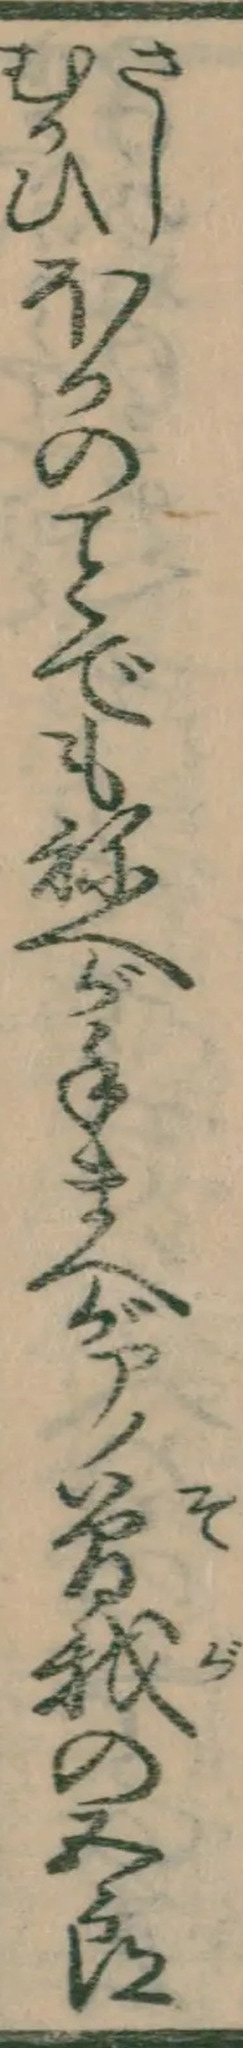さしむかひほかのことでもねへが手まへがアノ曽我の五郎
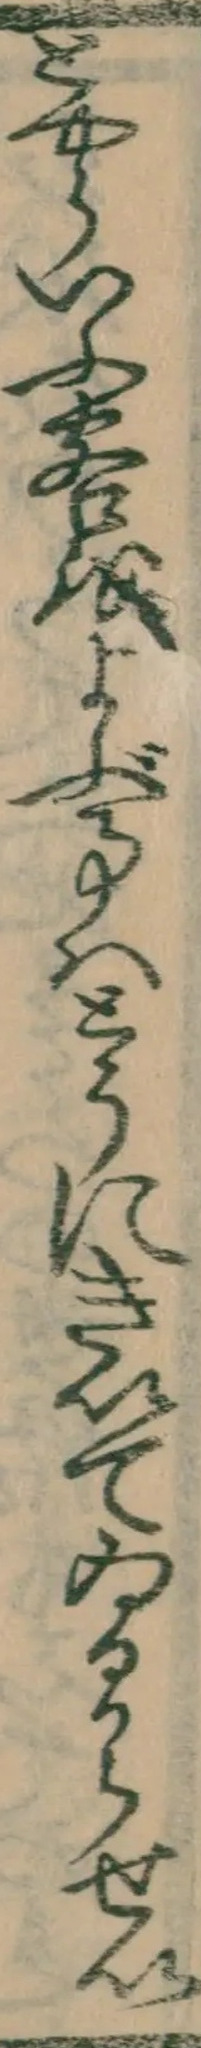をやらいふ客をよぶ事はとうにきいてゐるからせい
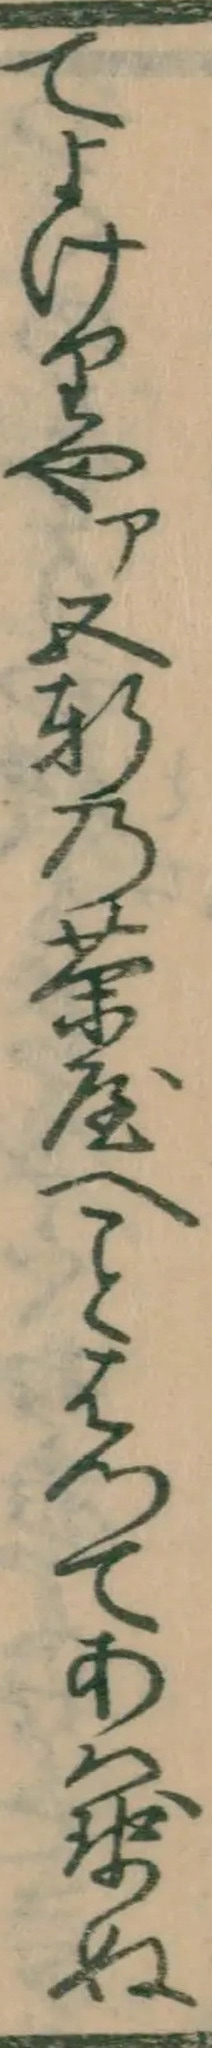てよけりやァ五軒の茶屋へことはつてあはせぬ
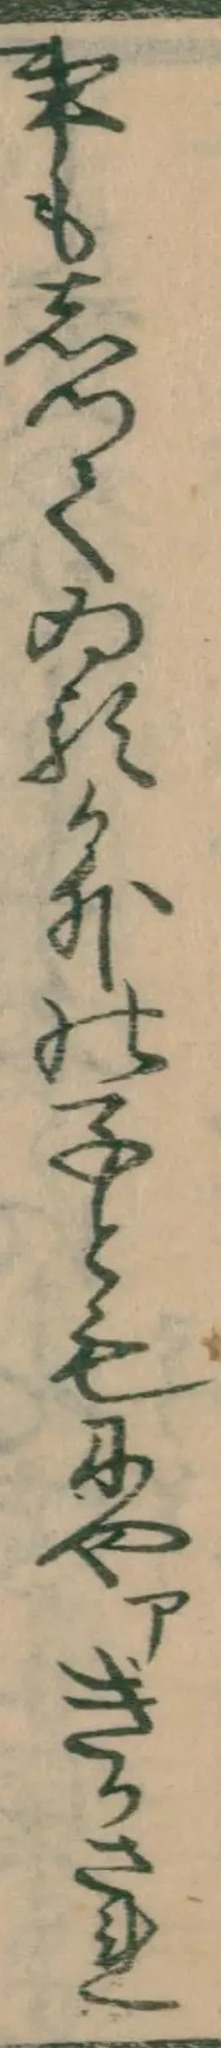事もしつてゐるか外の子ともにやァきかされ
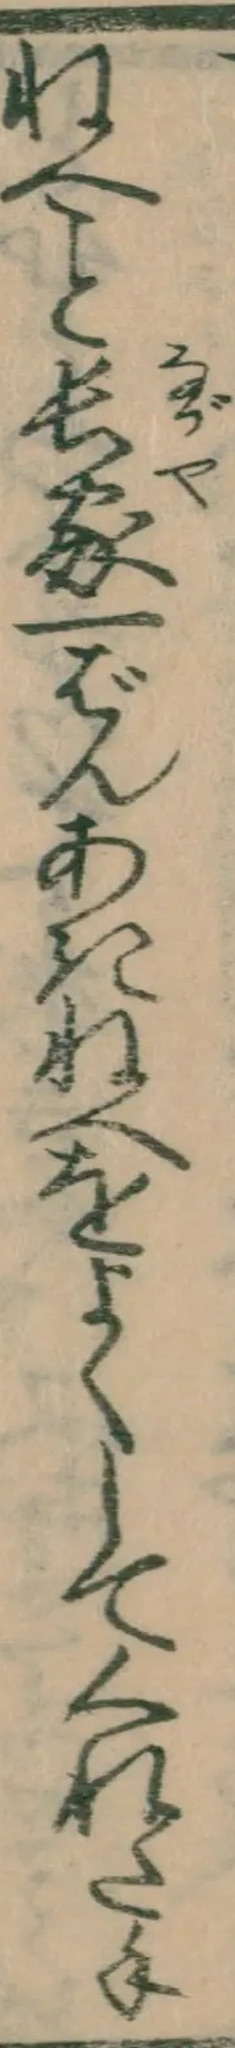ねへこと長家一ばんあきねへをよくしてくれた手
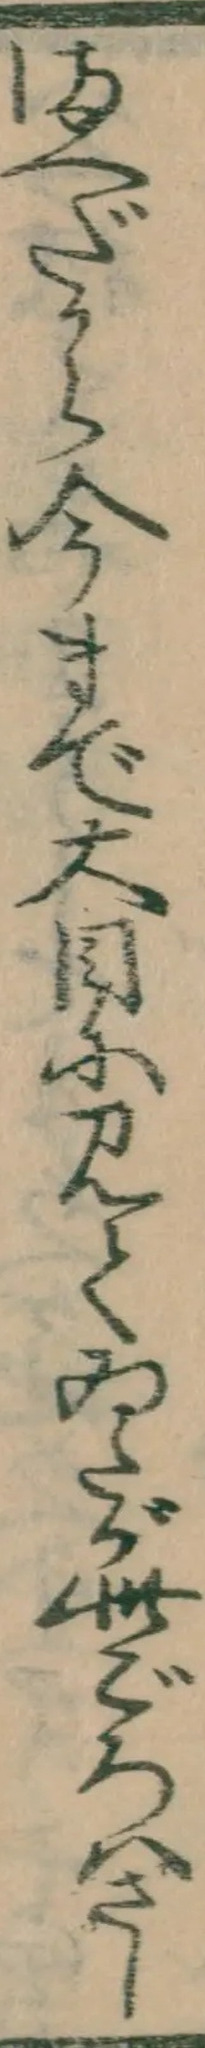まへだから今まで大目に見てゐたが此ごろはさし
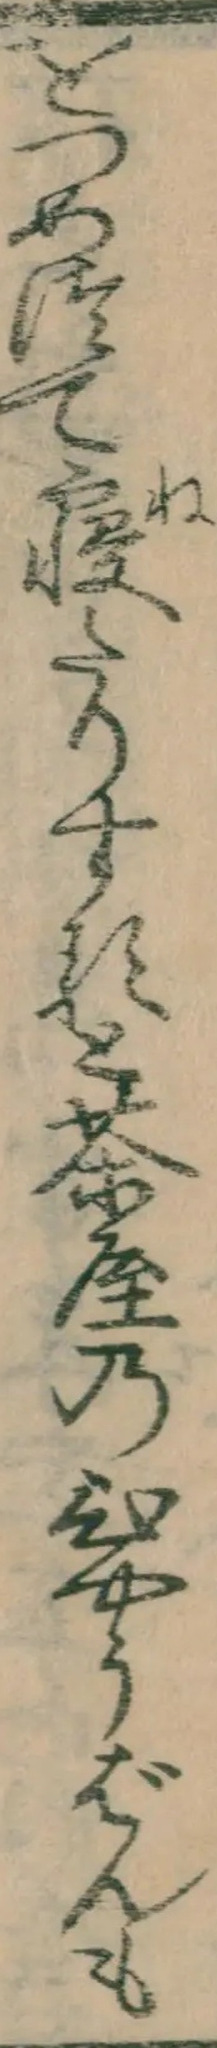をつめつて寝たりすると茶屋のひやうばんも
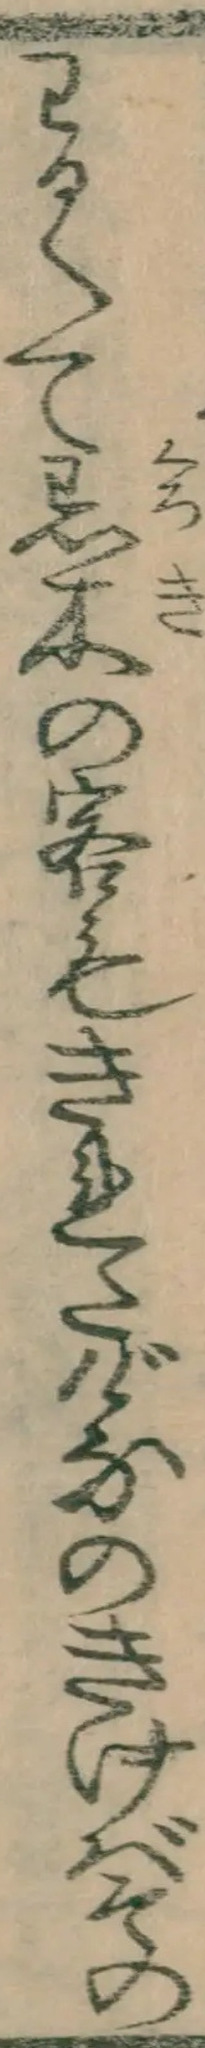わるくて黒木の客もきれたげなのきけばその
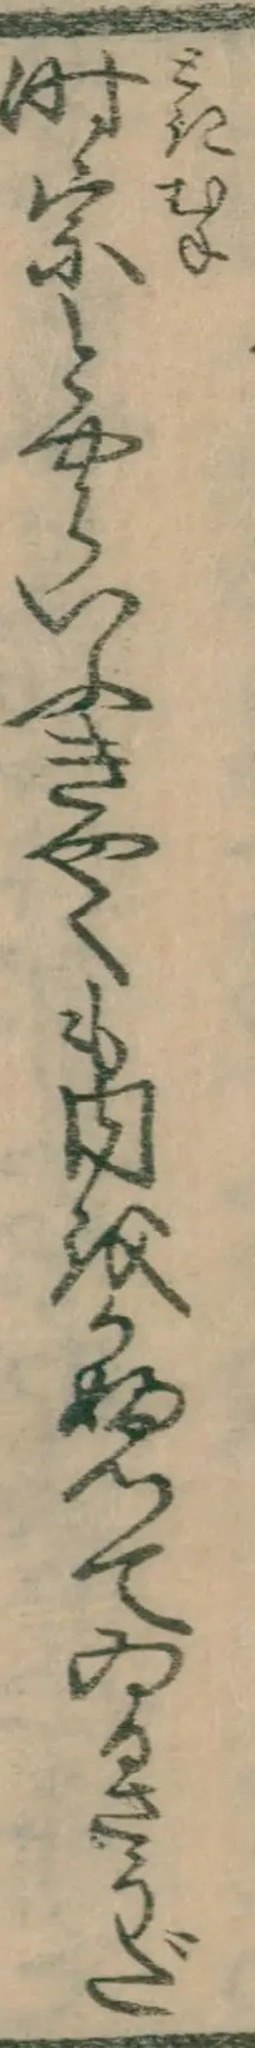時宗とやらいふきやくも内をかふつてゐるさうだ

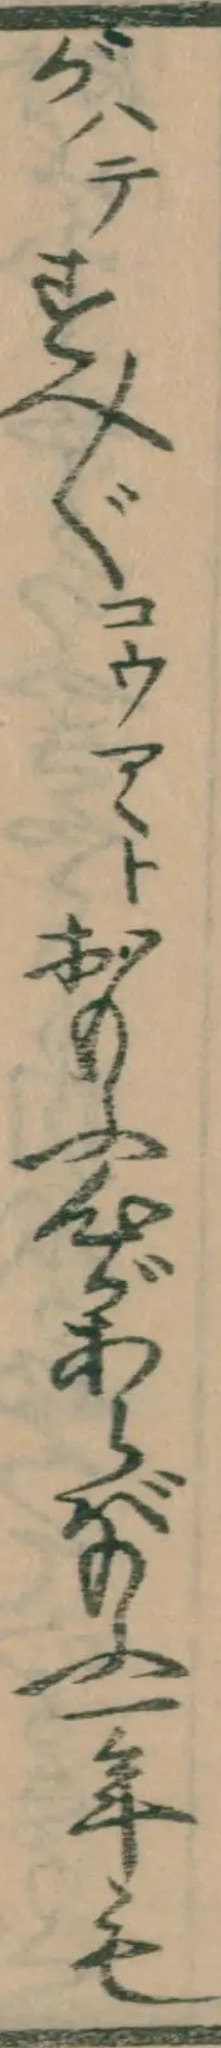がハテすへ〴〵コウアヽトおもふ心があらばもふ一年も
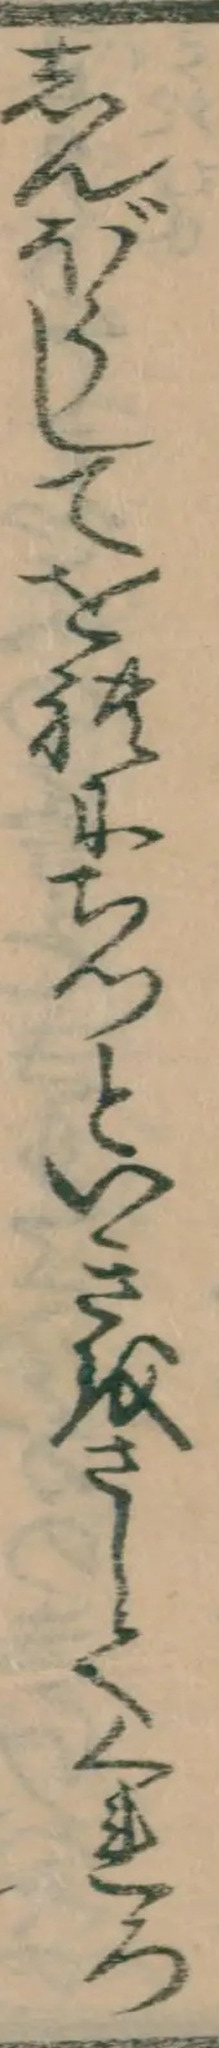しんぼうしてをれにちつといきをさしてくれろ
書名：教訓読本：大礒風俗仕懸文庫
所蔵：国立国会図書館 National Diet Library, JAPAN
